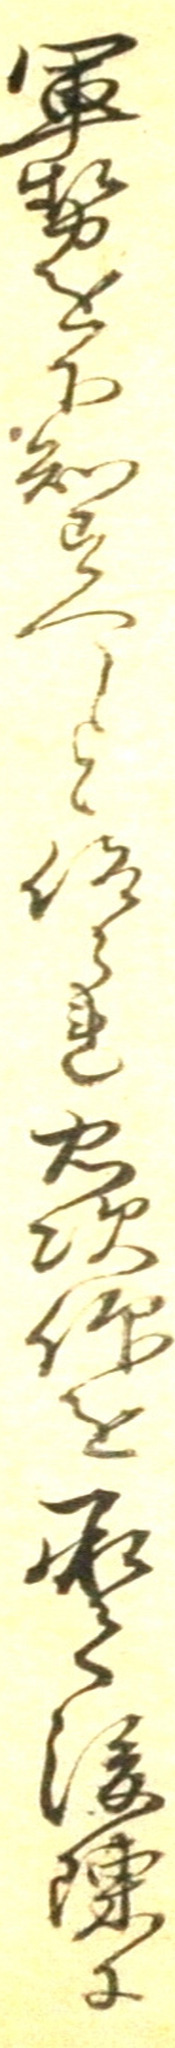軍勢を下知すへしと仰られ忠次仰を承りて後陣に
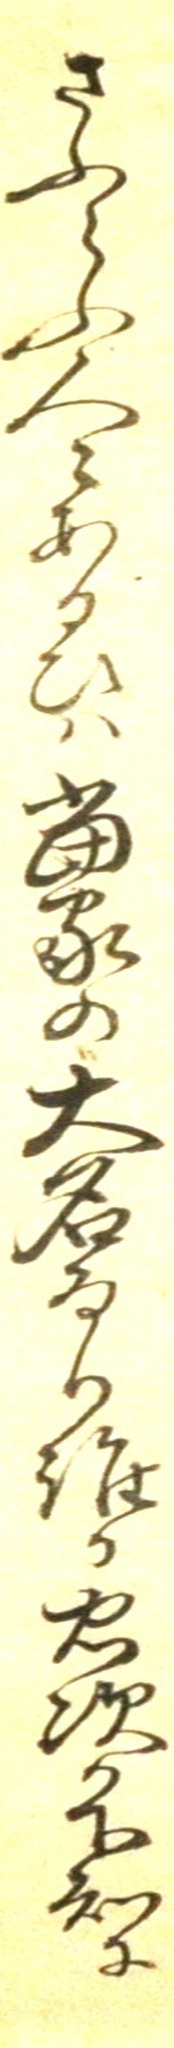さふらふ人々あるひは当家の大名なり誰か忠次の下知に
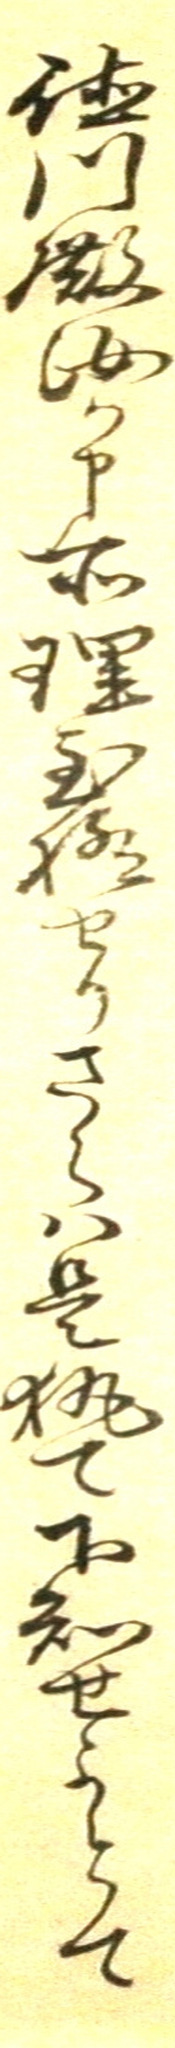徳川殿汝か申所理至極せりさらは是執て下知せよとて
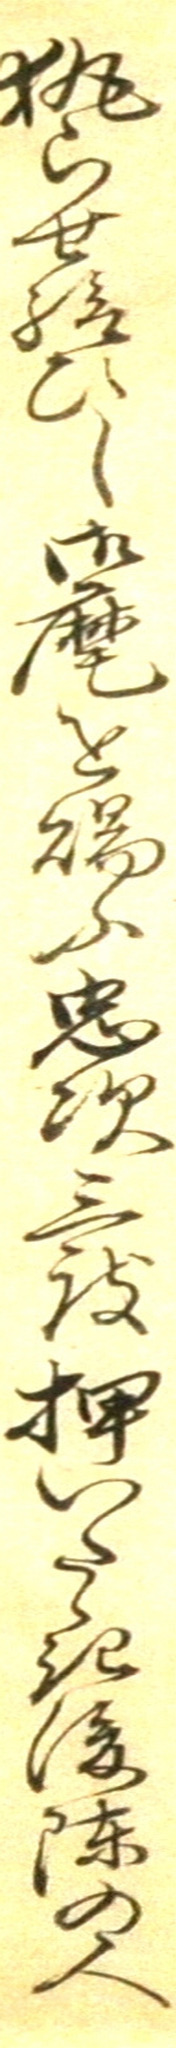執らせ給ひし御麾を賜ふ忠次三度押いたゝき後陣の人
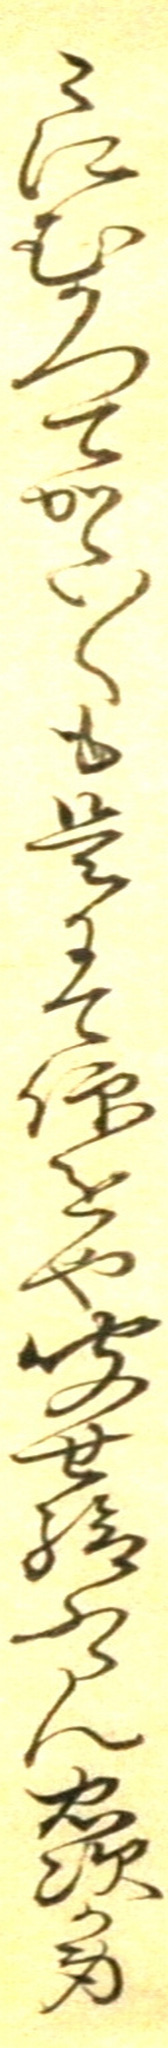々にむかつてかく〳〵も是にて仰をや聞せ給ふらん忠次か身
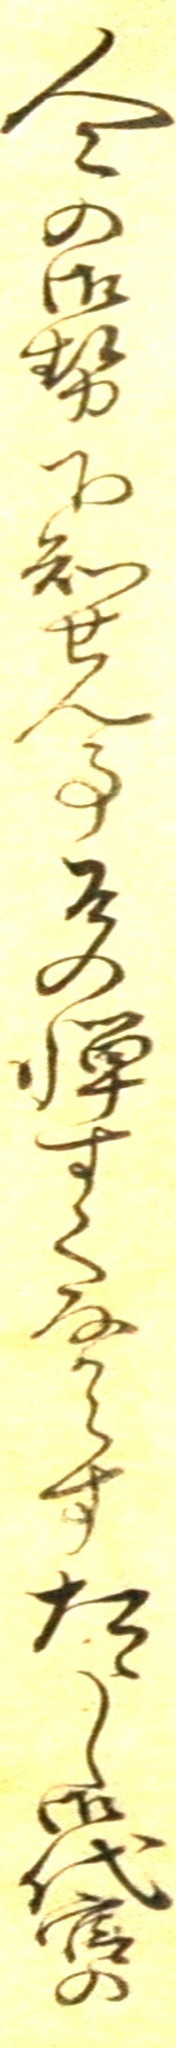人々の御勢下知せん事その憚すくなからすたゝし御代官の

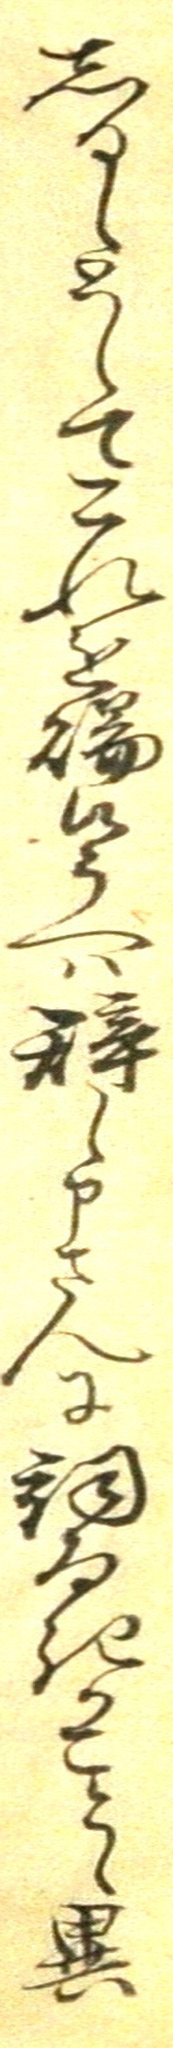しるしとしてこれを賜候うへは辞し申さんに詞なきかことし異
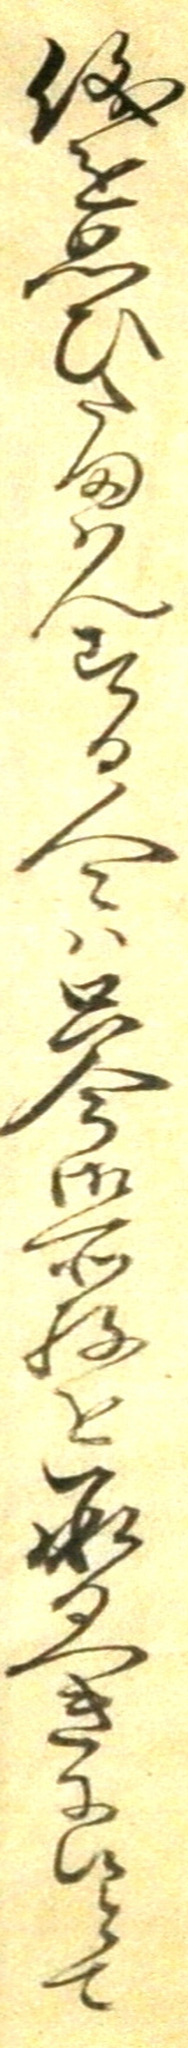儀を思ひたまわんする人々は只今御所存を承るへきに候とて
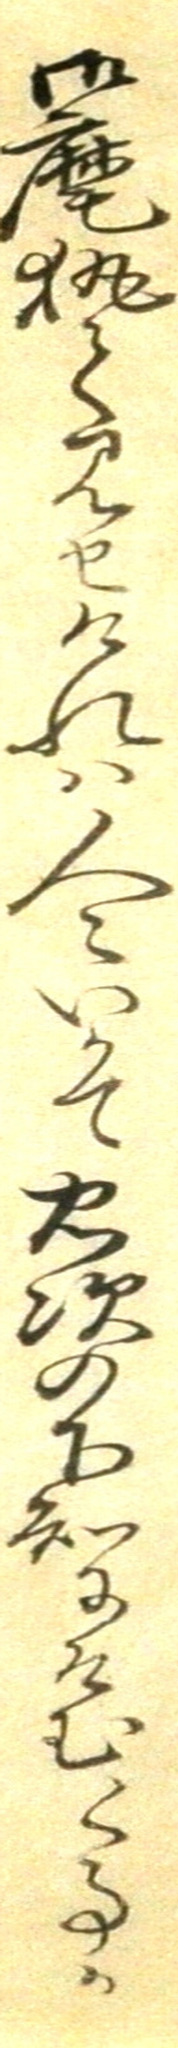御麾執て見せけれは人々いかて忠次の下知にそむく事か
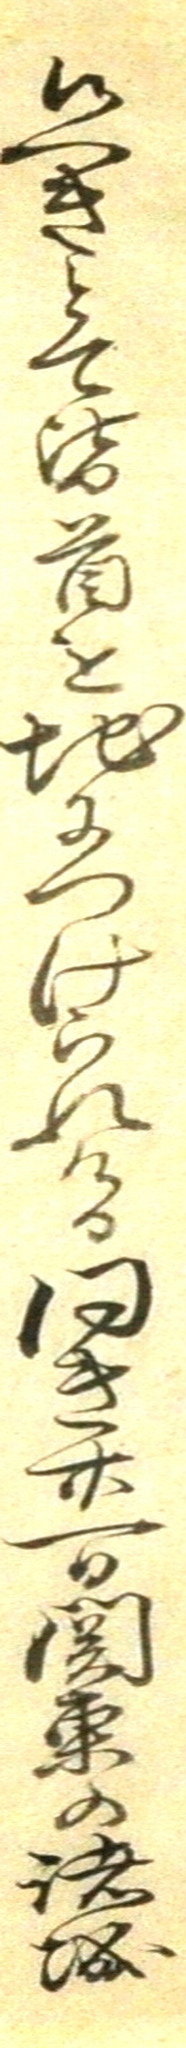候へきとて皆首を地につけられける同き廿一日関東の諸城
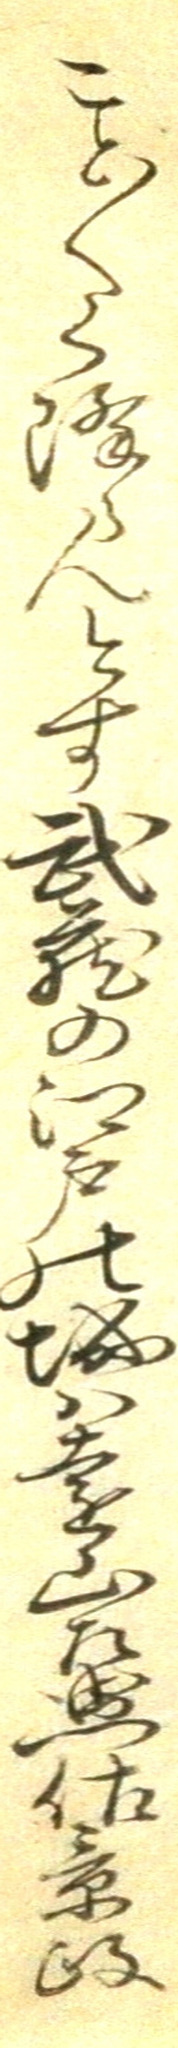こと〳〵く降らんとす武蔵の江戸の城は遠山左衛門佐景政
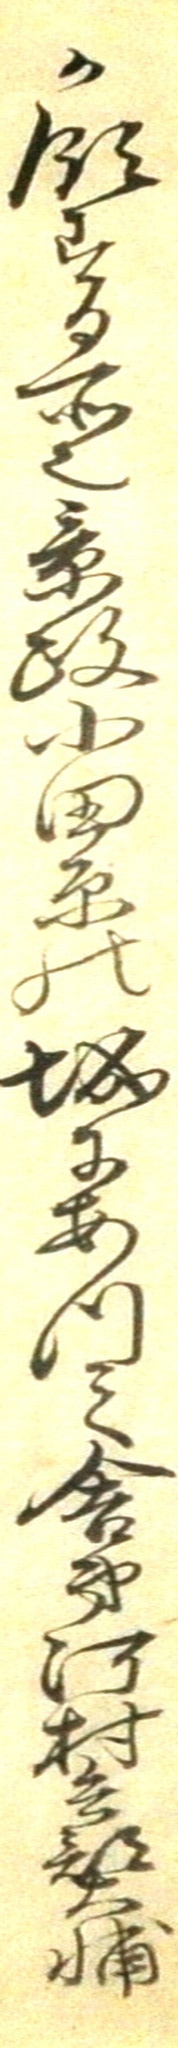か領する所也景政小田原の城にあつて舎弟河村兵部大輔
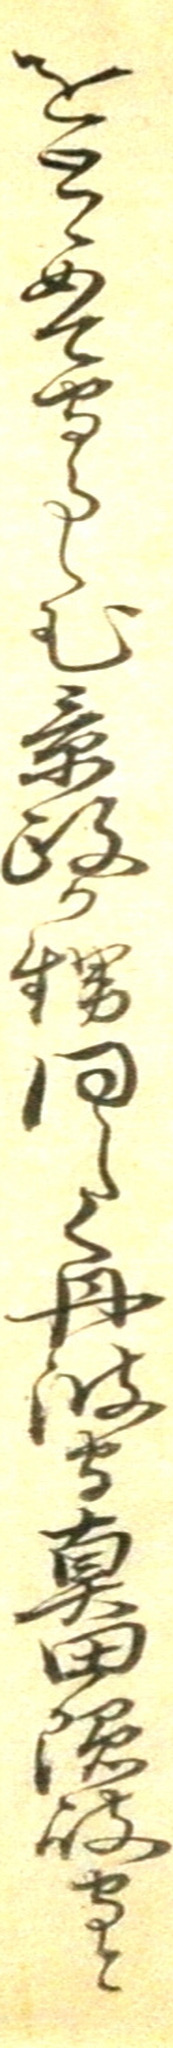をとゝめて守らしむ景政か甥同しく丹波守真田隠岐守と
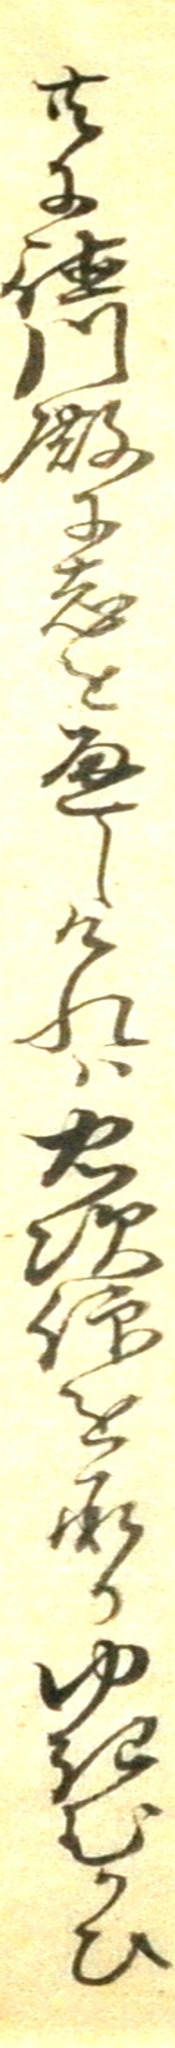共に徳川殿に志を通しけれは忠次仰を承りゆきむかひ
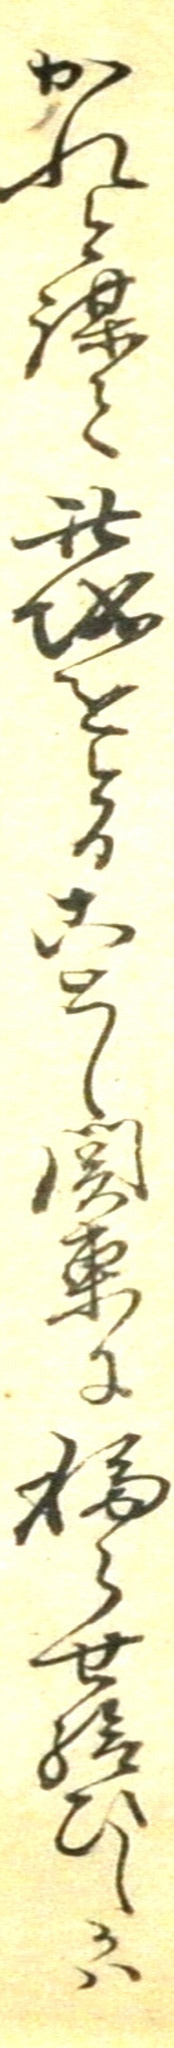かれと謀て此城をとることし関東に移らせ給ひしかは
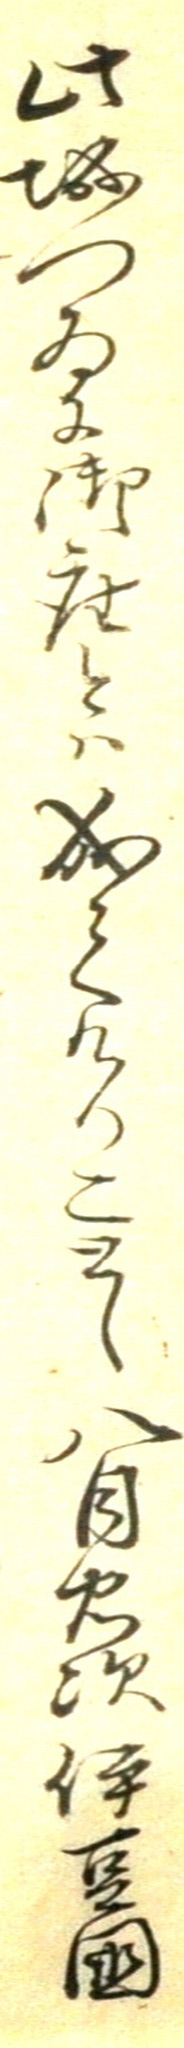此城つゐに御座とは成てけりことし八月忠次伊豆国
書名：藩翰譜（四・下）
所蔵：伊那市立高遠町図書館・合同会社AMANE
